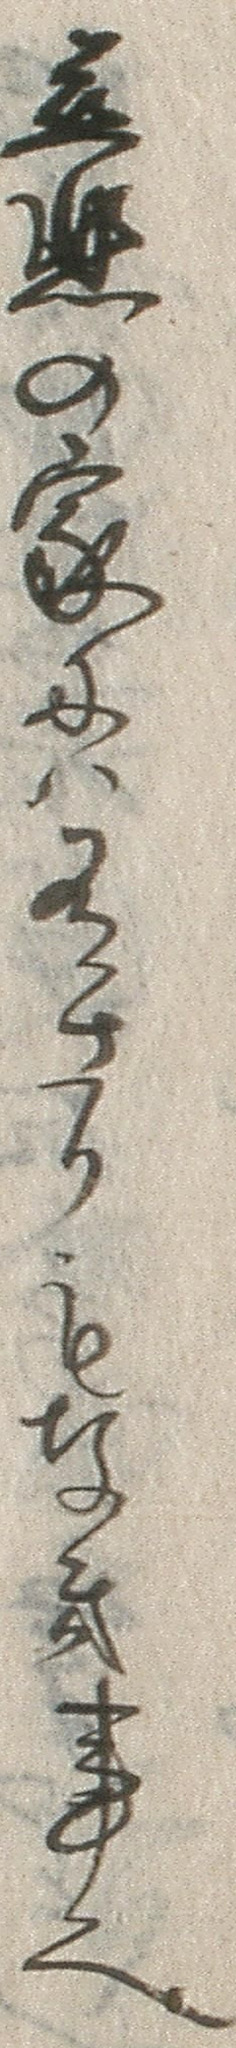慈悲の家には有さりもなき事也
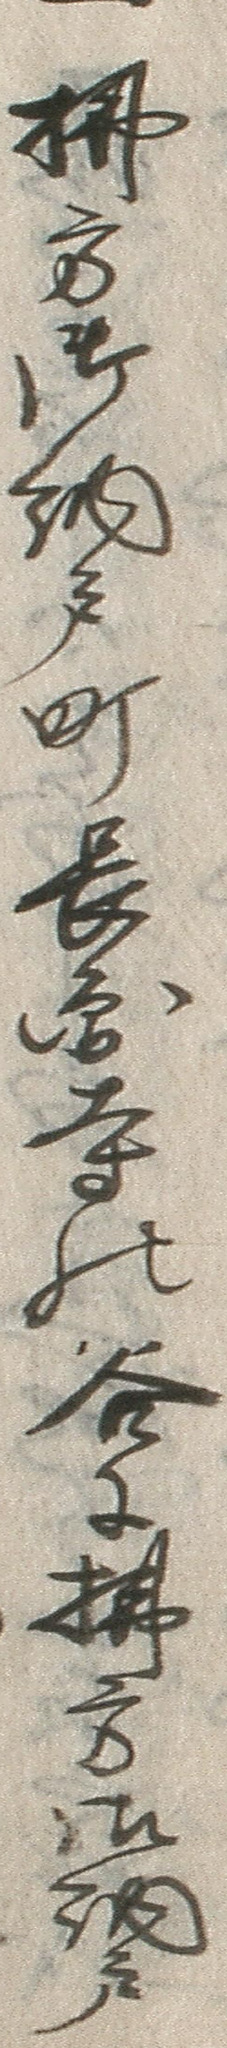一払方御納戸町長円寺の谷に払方御納戸
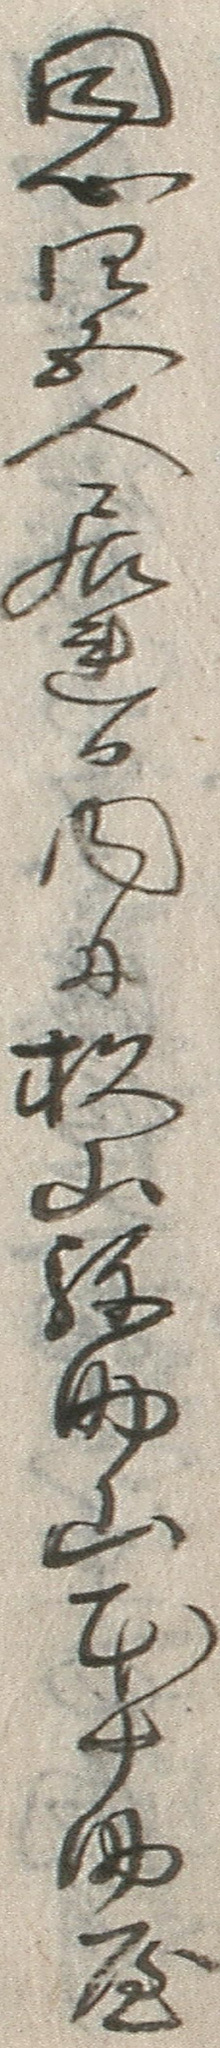同心四五人居れる内に杉山弥助山本十助屋
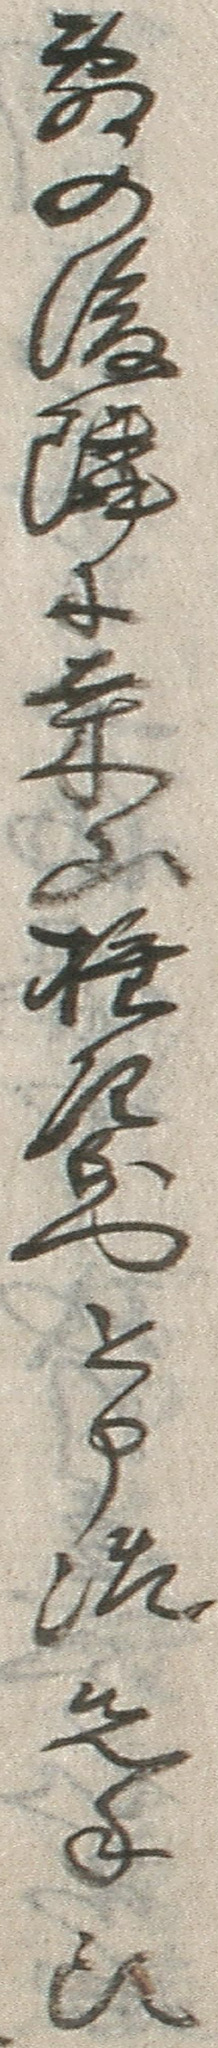敷の後隣に桑山権左衛門と申御先手頭
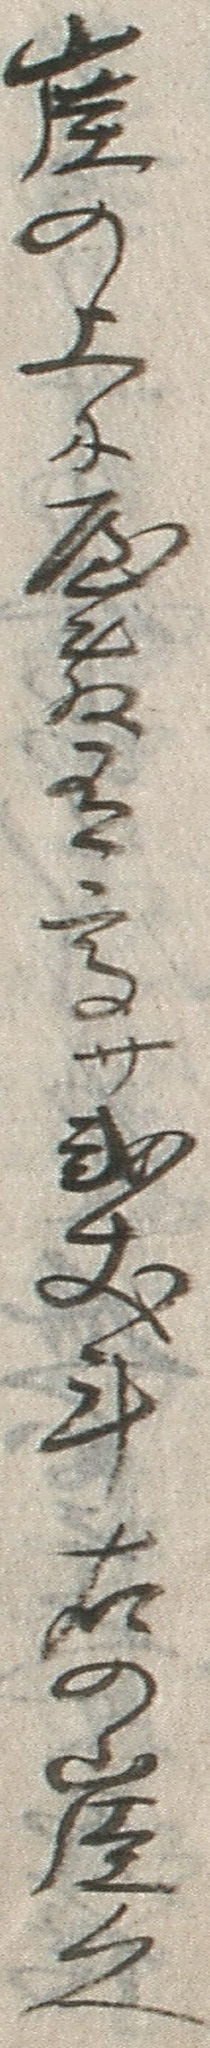崖の上に屋敷有高サ弐丈斗右の崖くへ
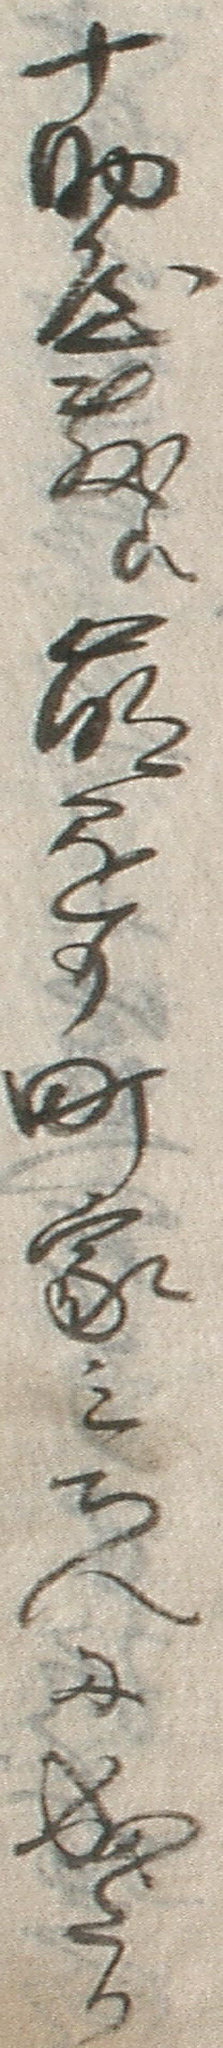十助屋敷江崩懸り町家みちんに成たり

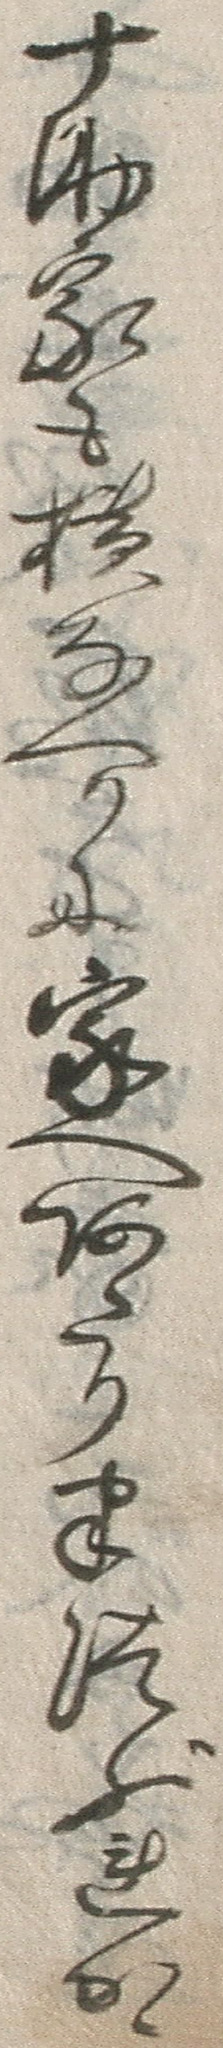十助家も横なくりに家へあたり半つふれかゝ
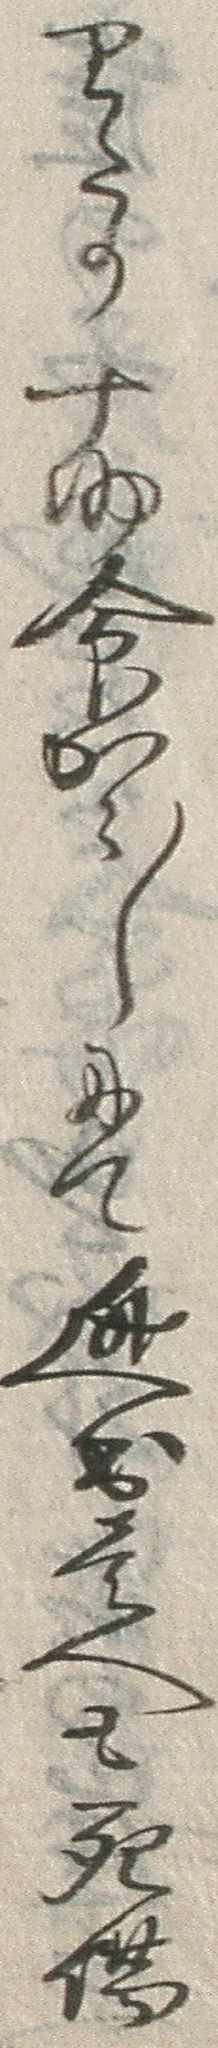りたり十助命から〳〵にて逃出壱人は死傷
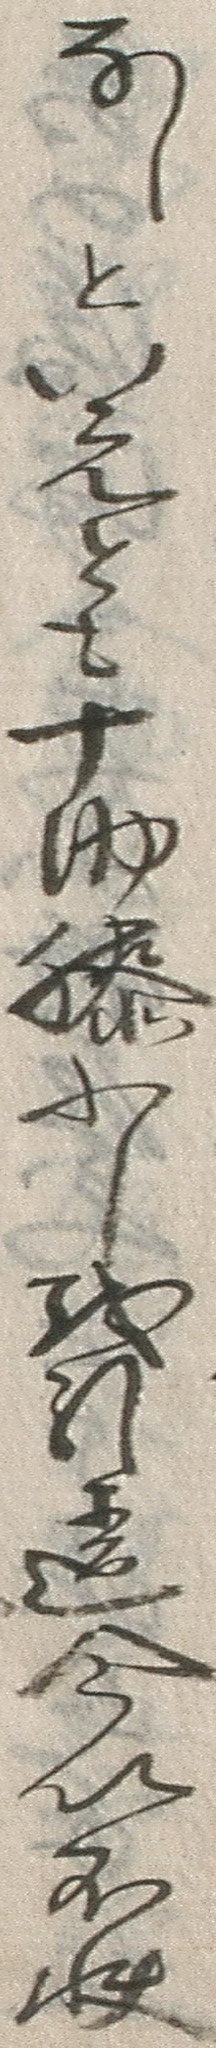なしといえとも十助膝少しを引違今以不快
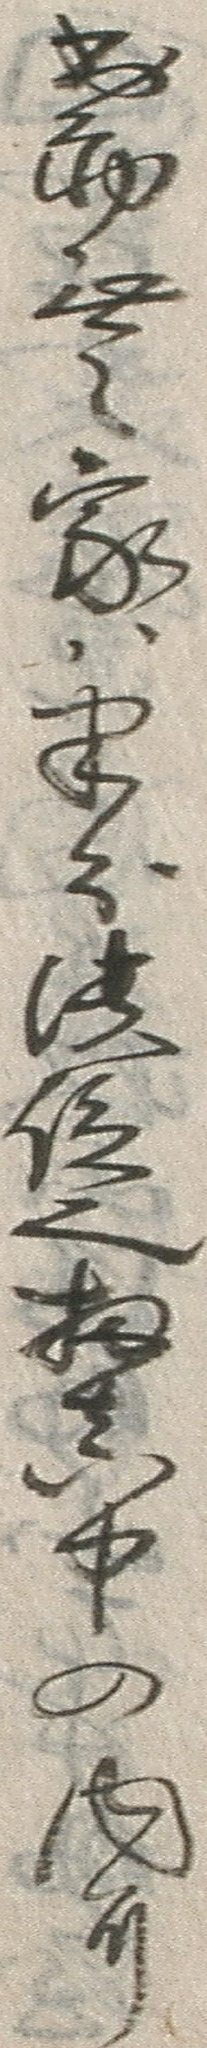出動無之家は半分潰位也扨真中の内に
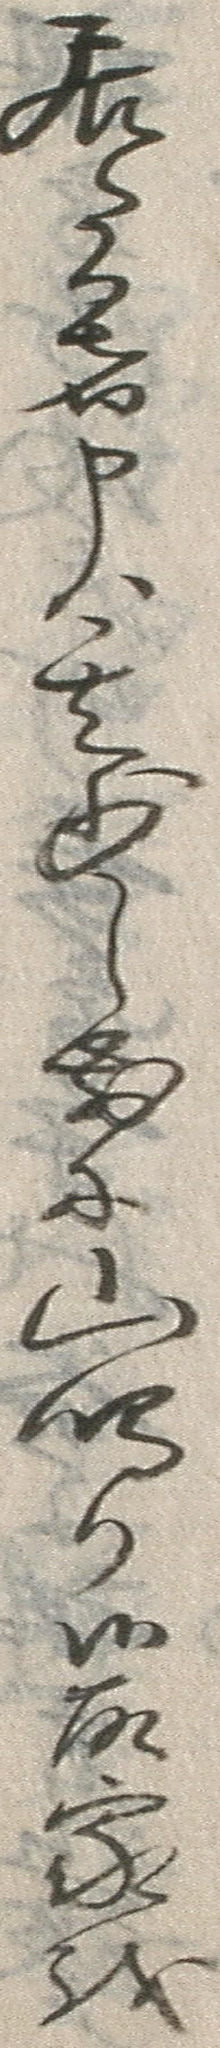居たる者申は少し前に山鳴り候故家を
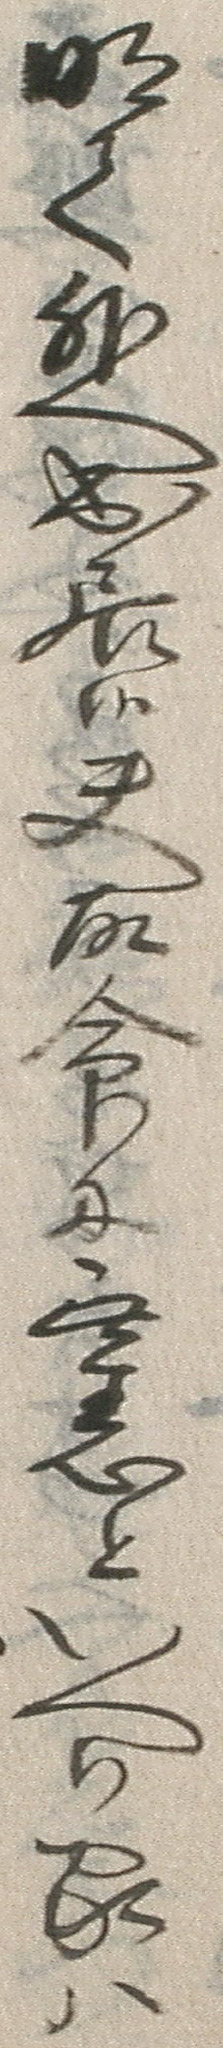明て外へ出居候夫故命に無恙といへり家は
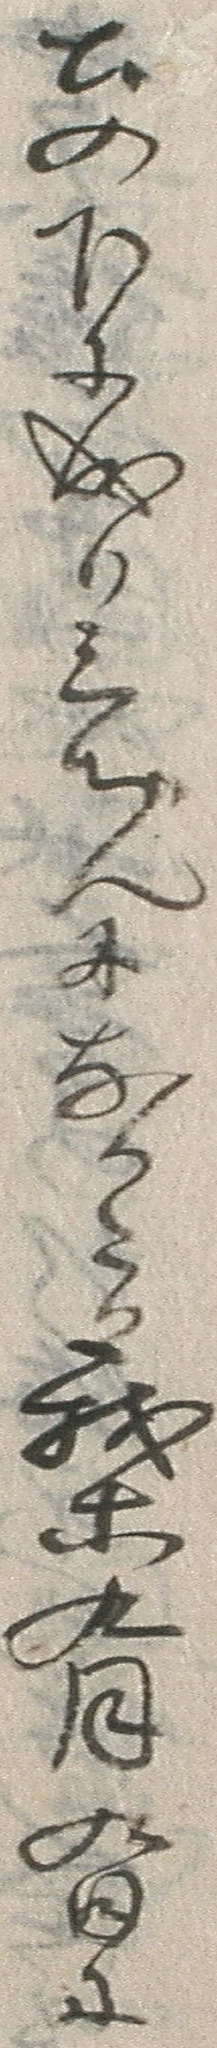土の下に成りみちんになりたり我等九月九日に
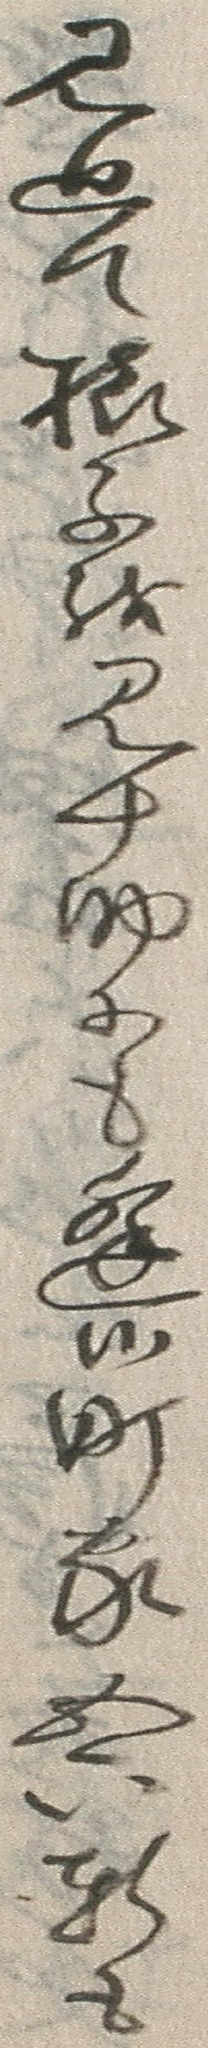見廻て様子を見十助にも逢候町家五六軒も
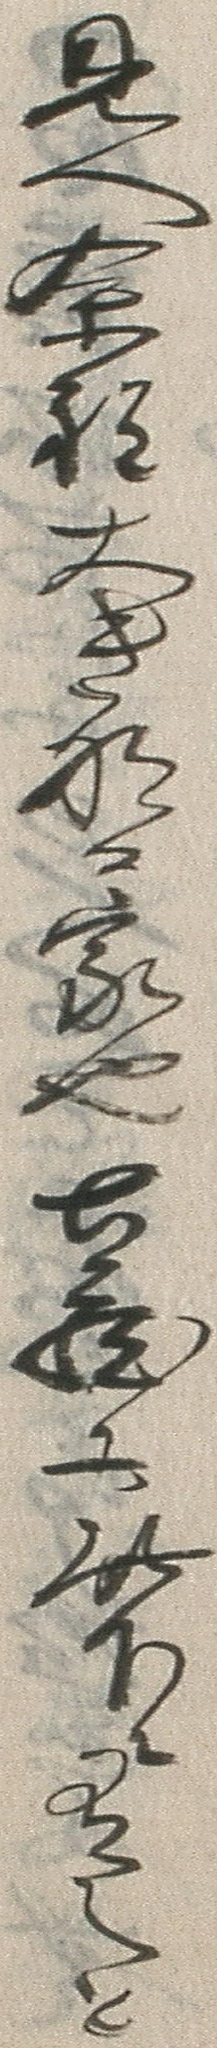見へ余程大きなる家也土蔵も此下に有之と
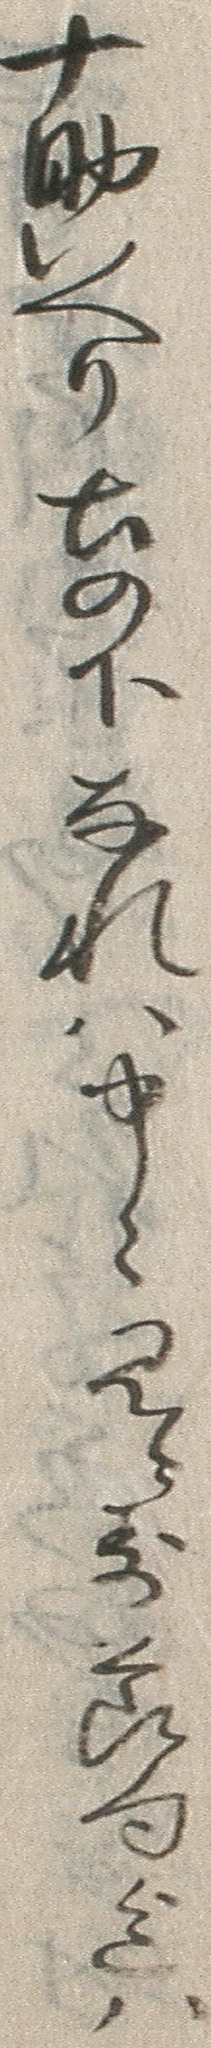十助いへり土の下なれは中々見たらす節句迄は
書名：享保十三年江戸洪水記
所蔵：東京大学地震研究所図書室 Earthquake Research Institute Library, The University of Tokyo, JAPAN
